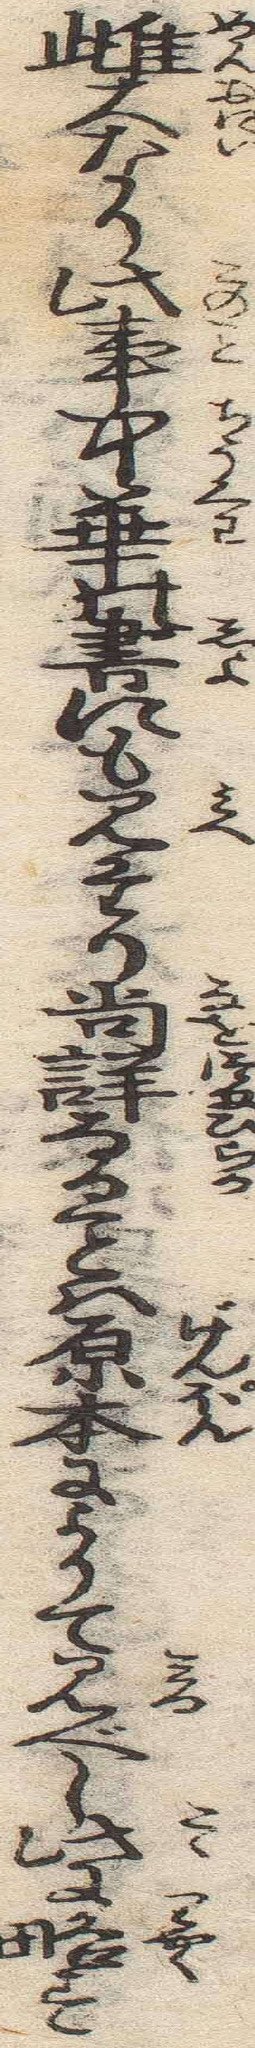雌大なり此事中華の書にも見たり尚詳なることは原本によりて見べし此に略す
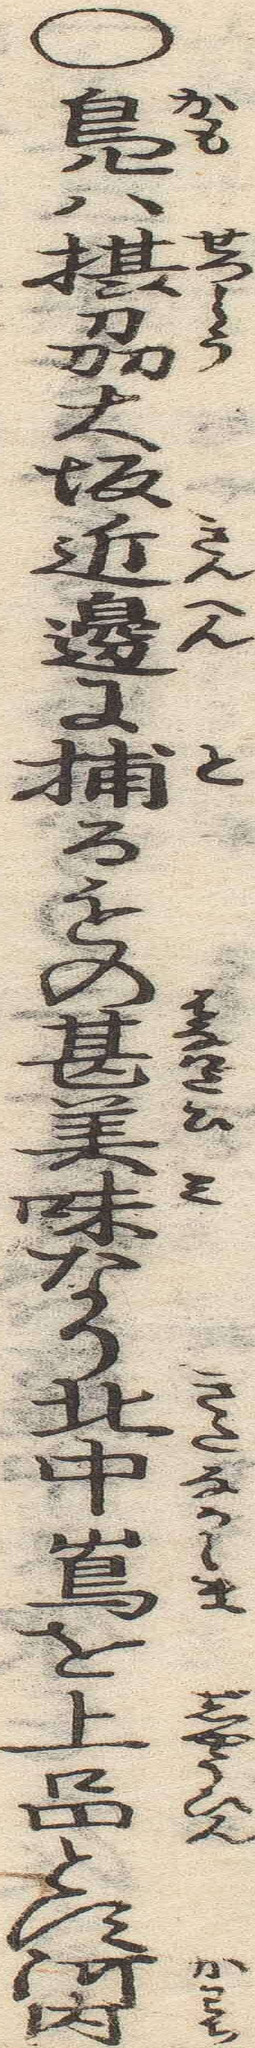○鳧は摂州大坂近辺に捕るもの甚美味なり北中島を上品とす河内
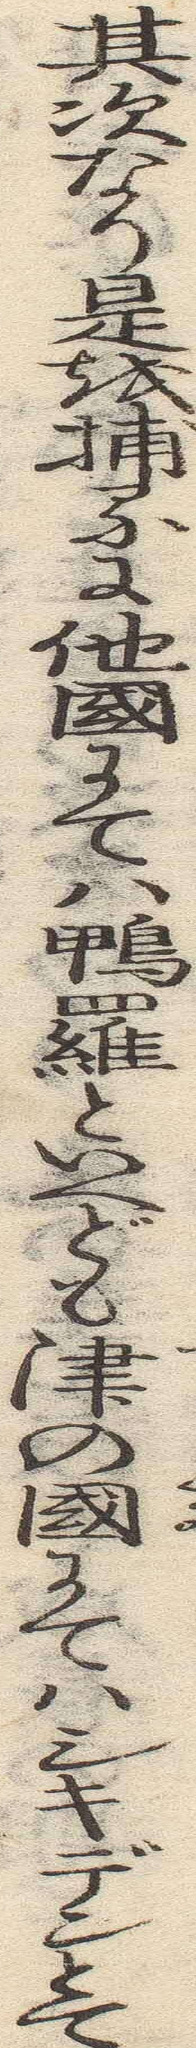其次なり是を捕るに他国にては鴨羅といへども津の国にてはシキデンとて
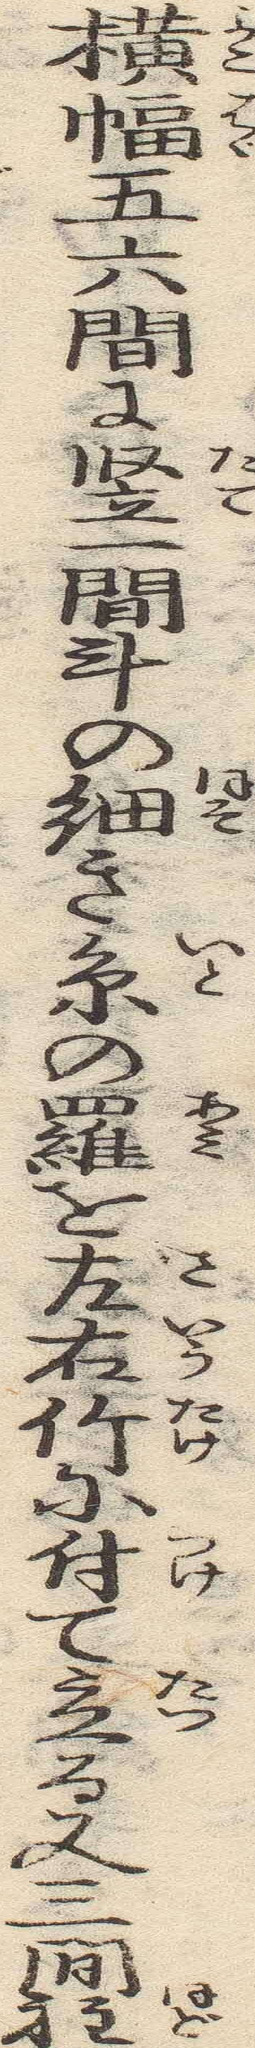横幅五六間に竪一間斗の細き糸の羅を左右竹に付て立る又三間程
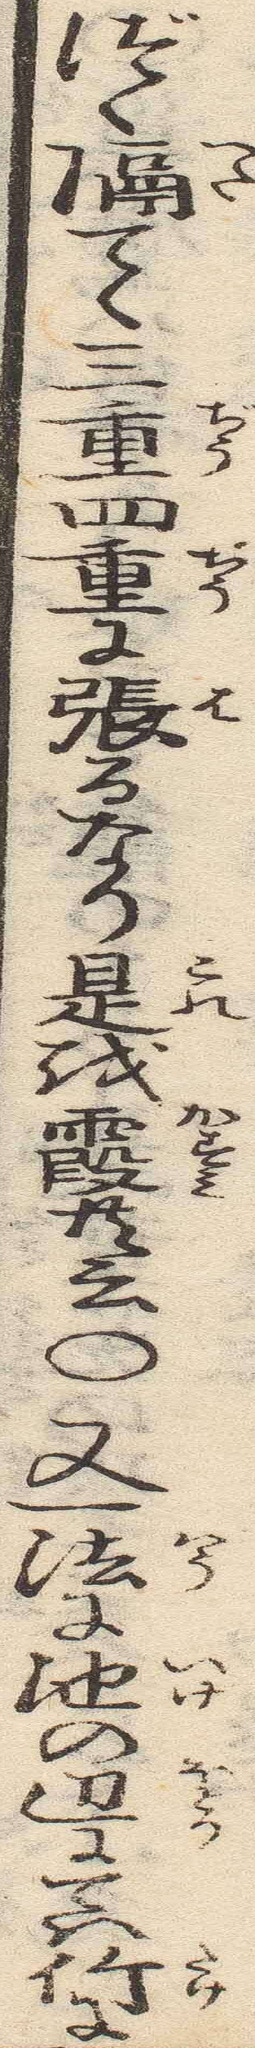づゝ隔てゝ三重四重に張るなり是を霞共云○又一法に池の辺にては竹に
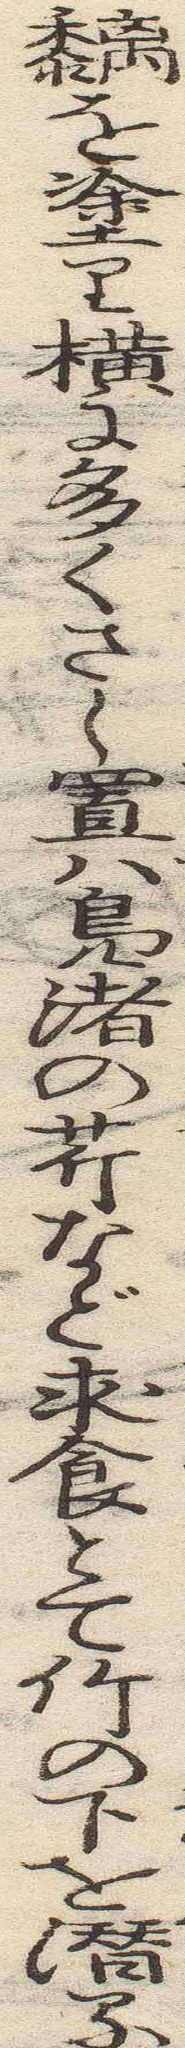黐を塗り横に多くさし置ば鳧渚の芹など求食とて竹の下を潜る
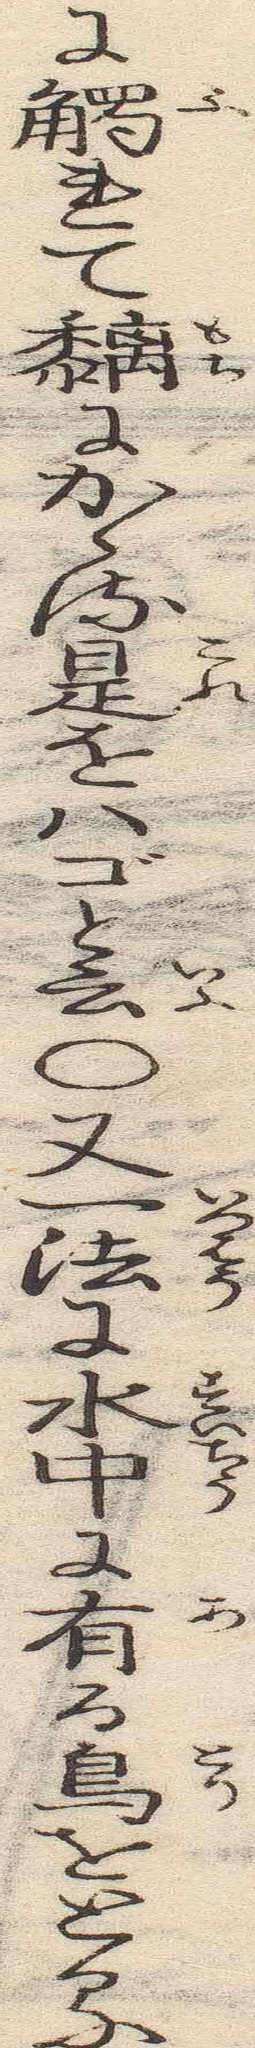に触れて黐にかゝる是をハゴと云○又一法に水中に有る鳥をとる
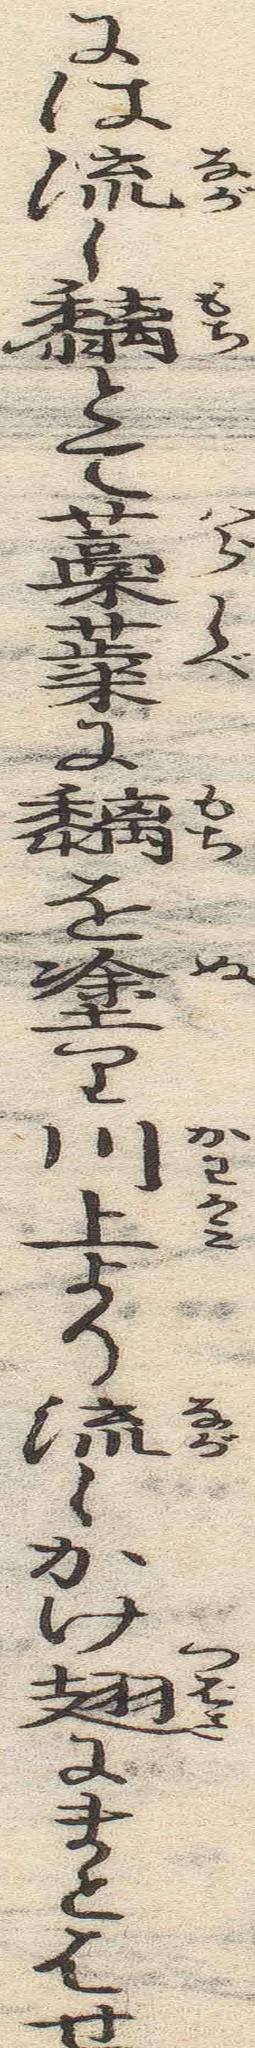には流し黐とて藁蘂に黐を塗り川上より流しかけ翅にまとはせ
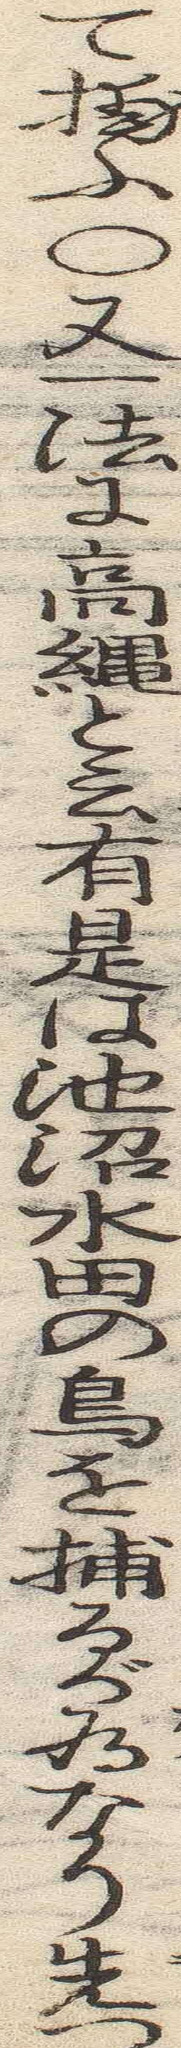て捕ふ○又一法に高縄と云有是は池沼水田の鳥を捕るが為なり先づ
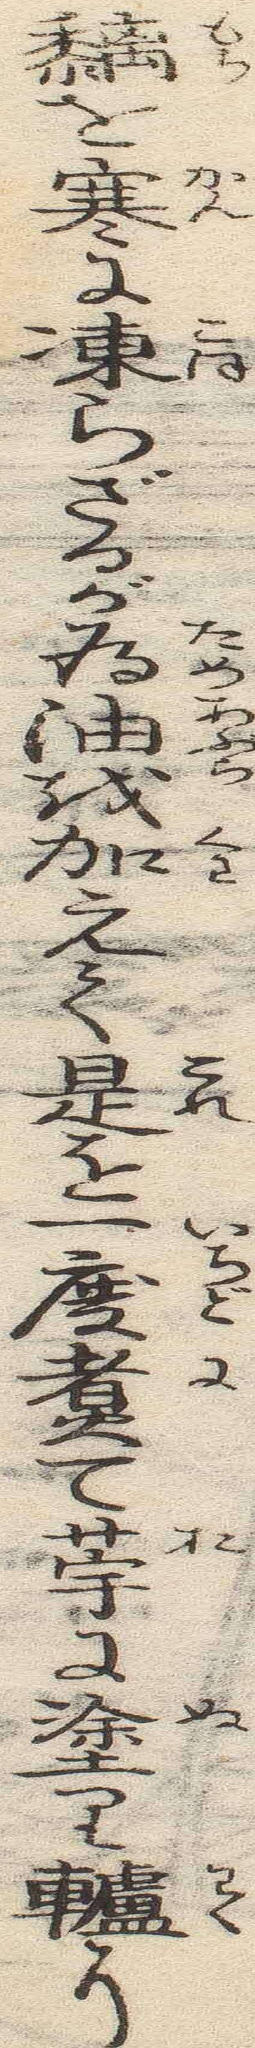黐を寒に凍らざるが為油を加えて是を一度煮て荢に塗り轤に
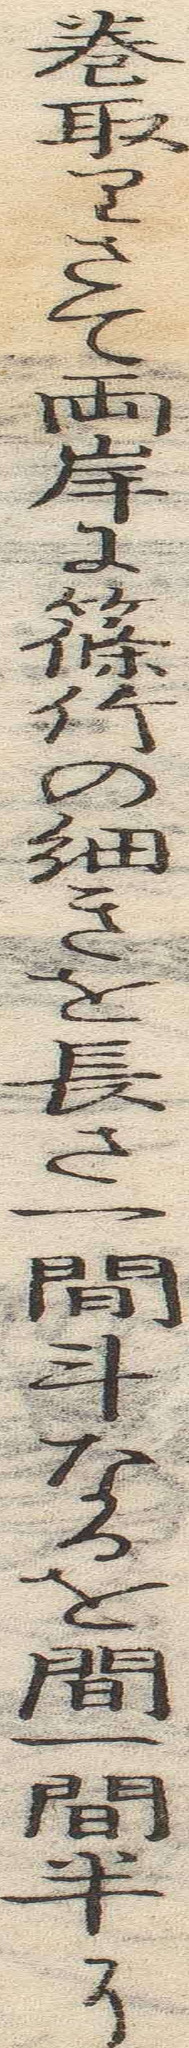巻取りさて両岸に篠竹の細きを長さ一間斗なるを間一間半に
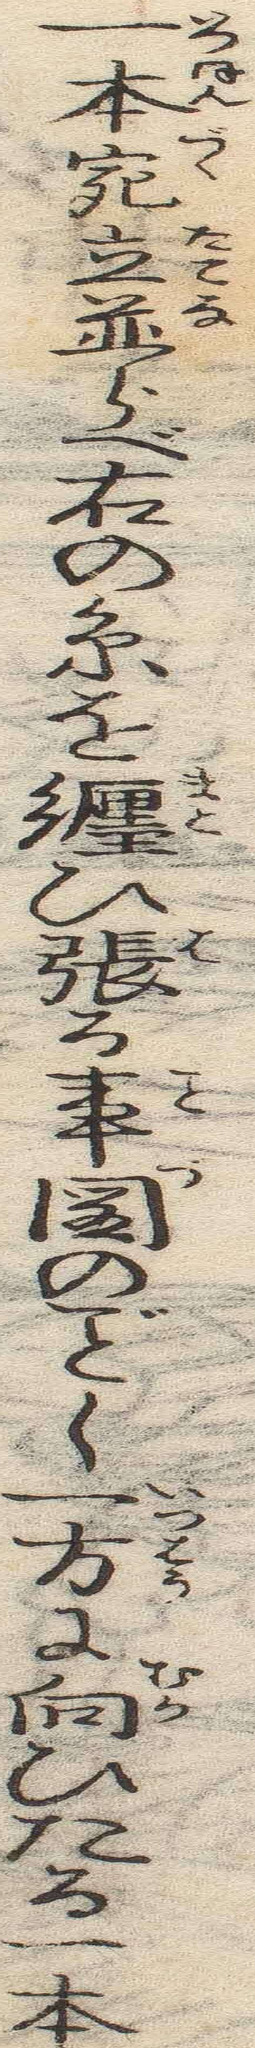一本宛立並らべ右の糸を纏ひ張る事図のごとし一方に向ひたる一本
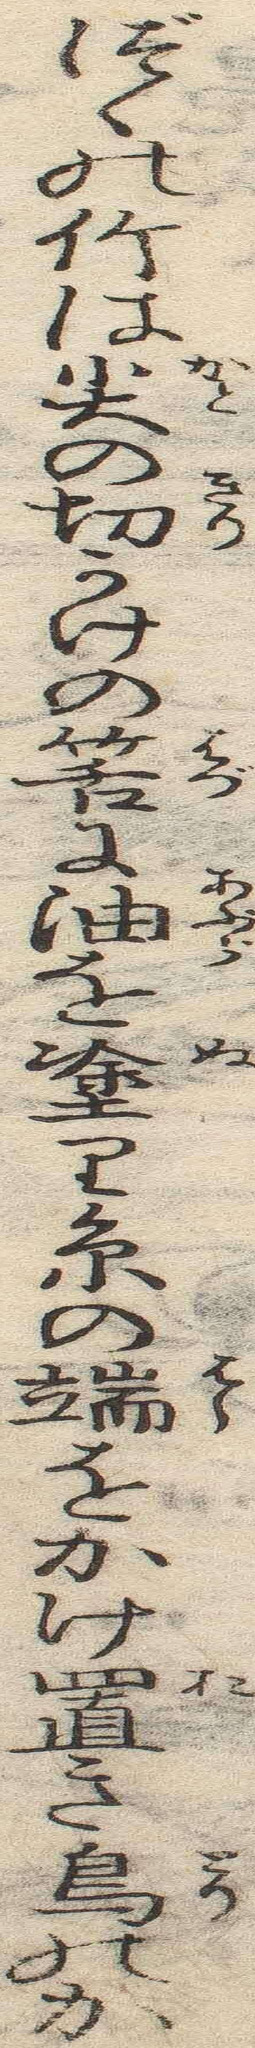づゝの竹は尖の切かけの筈に油を塗り糸の端をかけ置き鳥のか
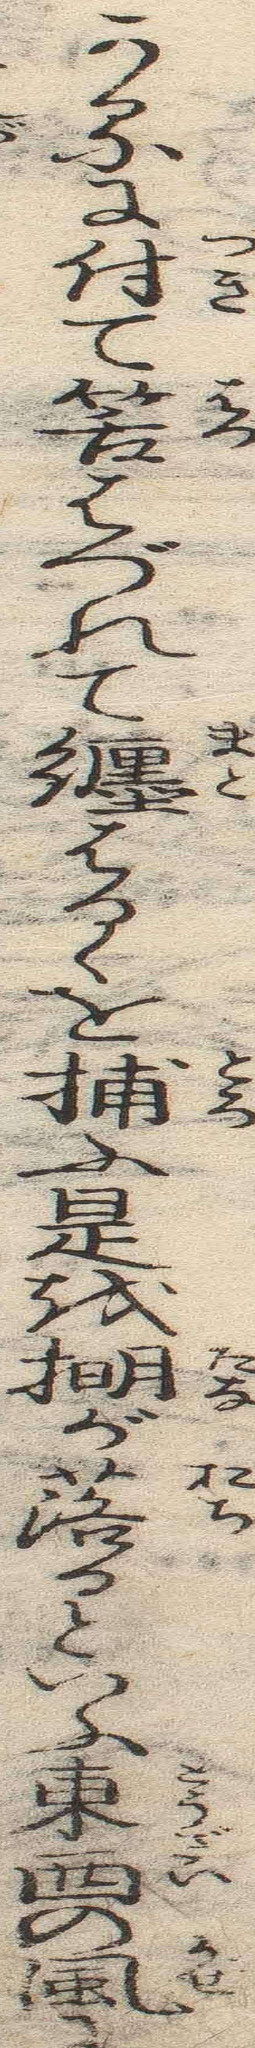かるに付て筈はづれて纏はるゝを捕ふ是を棚が落るといふ東西の風に
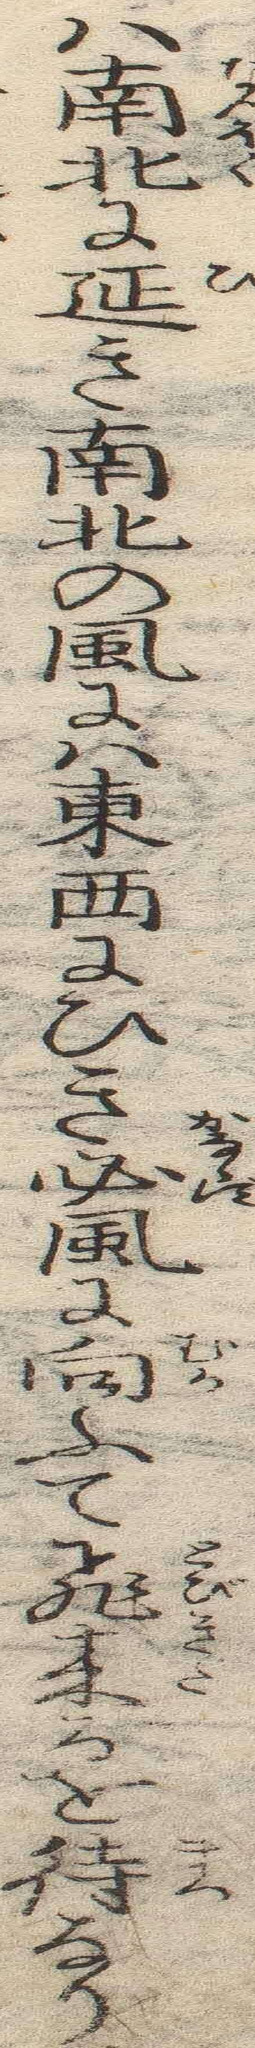は南北に延き南北の風には東西にひき必風に向ふて飛来るを待なり
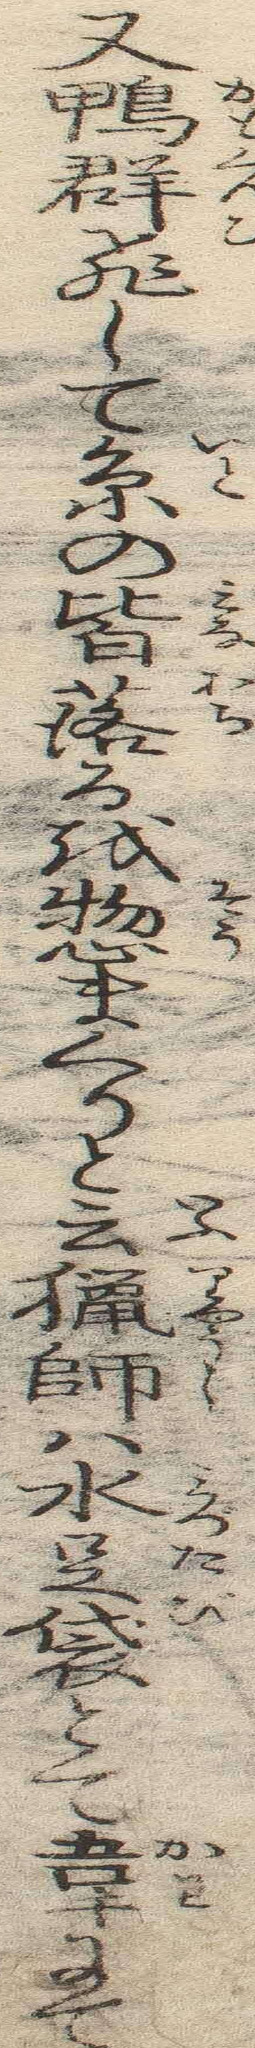又鴨群飛して糸の皆落るを惣まくりと云猟師は水足袋とて韋にて
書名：日本山海名産図会
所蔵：東京学芸大学附属図書館 国文学研究資料館
